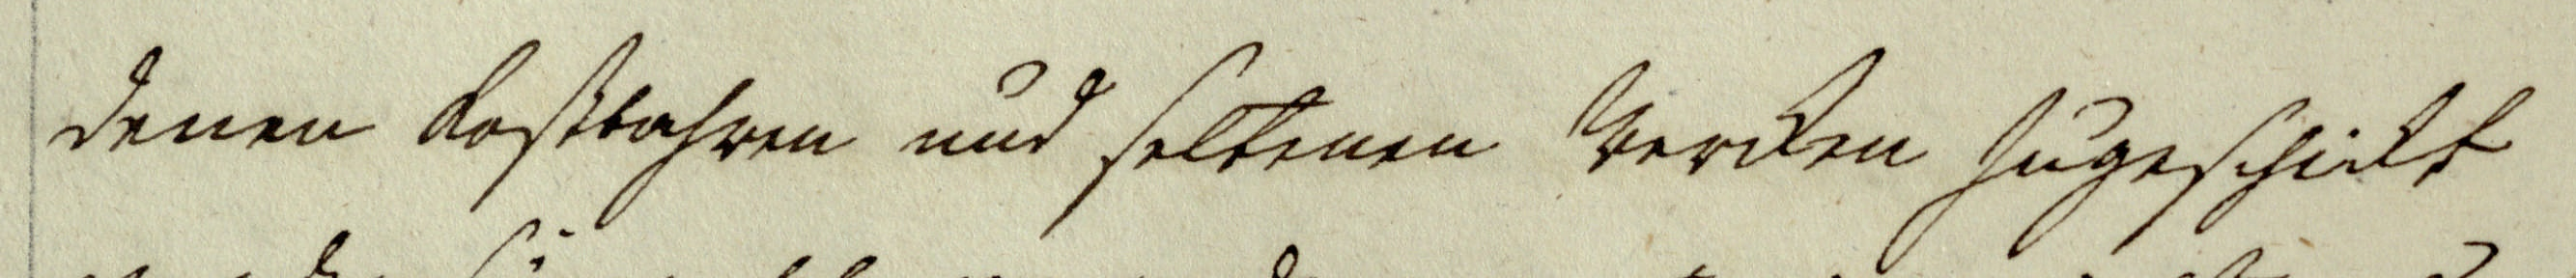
denen kostbahren und seltenen Wercken zugeschickt
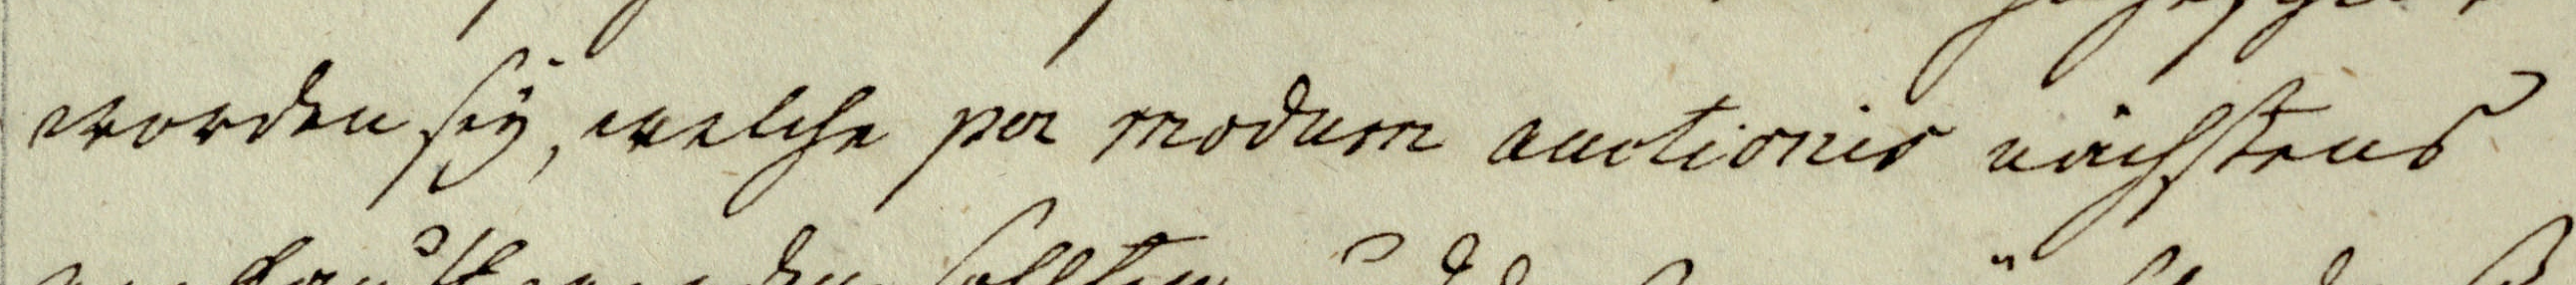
worden seÿ, welche per modum auctionis nächstens
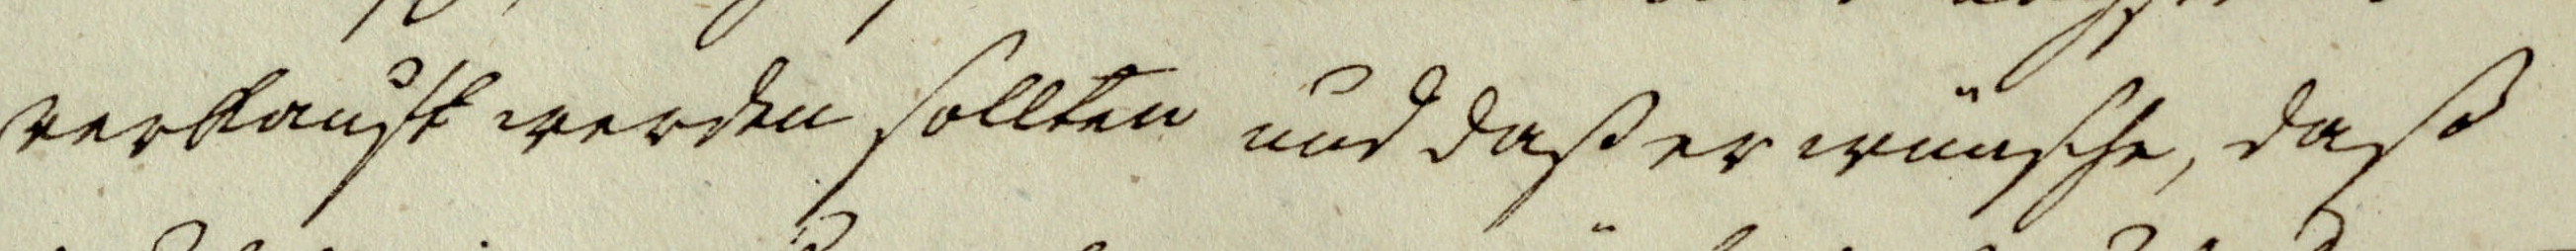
verkauft werden sollten und daß er wünsche, daß
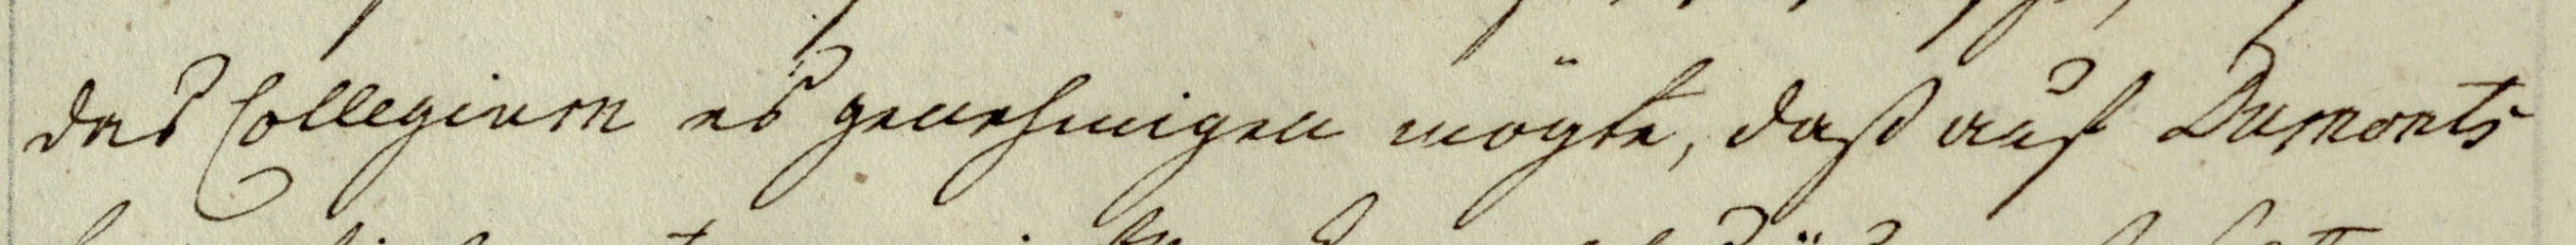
das Collegium es genehmigen mögte, daß auf Dumonts
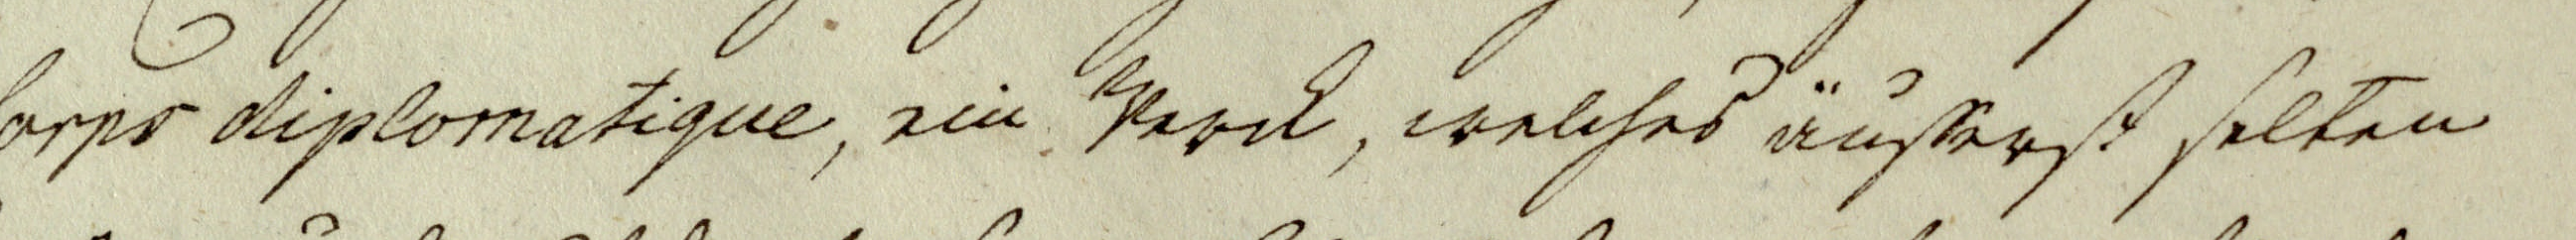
Corps diplomatique, ein Werck, welches äusserst selten
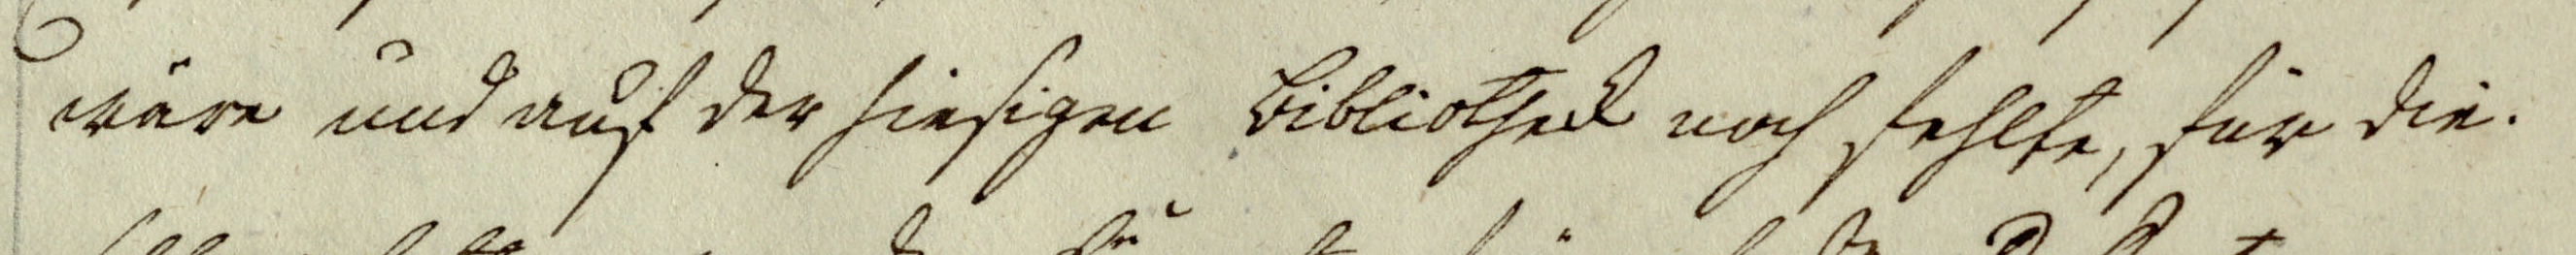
wäre und auf der hiesigen Bibliothek noch fehlte, für die¬
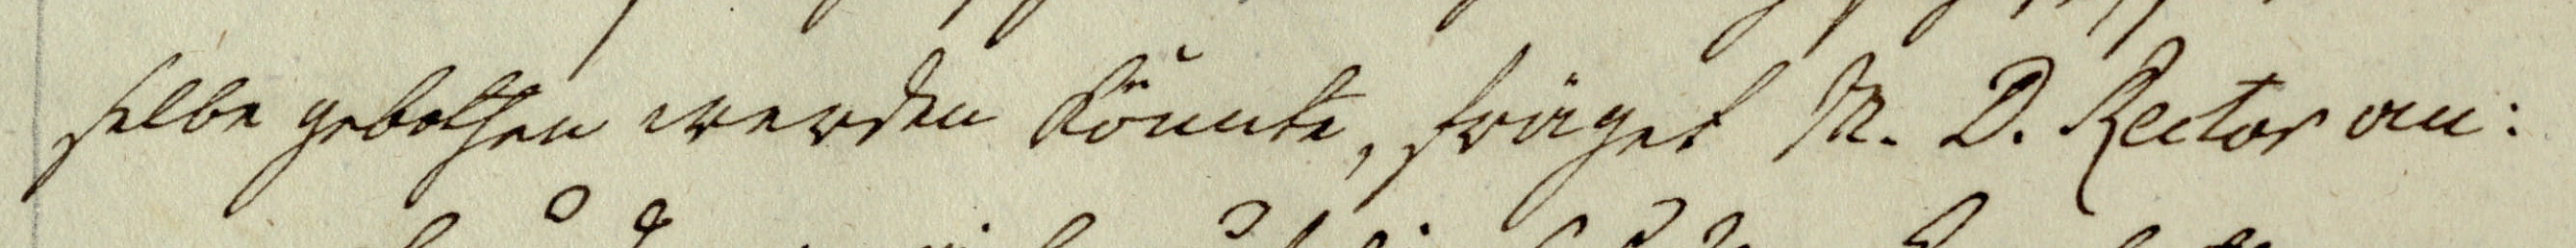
selbe gebothen werden könnte, fräget M. D. Rector an:
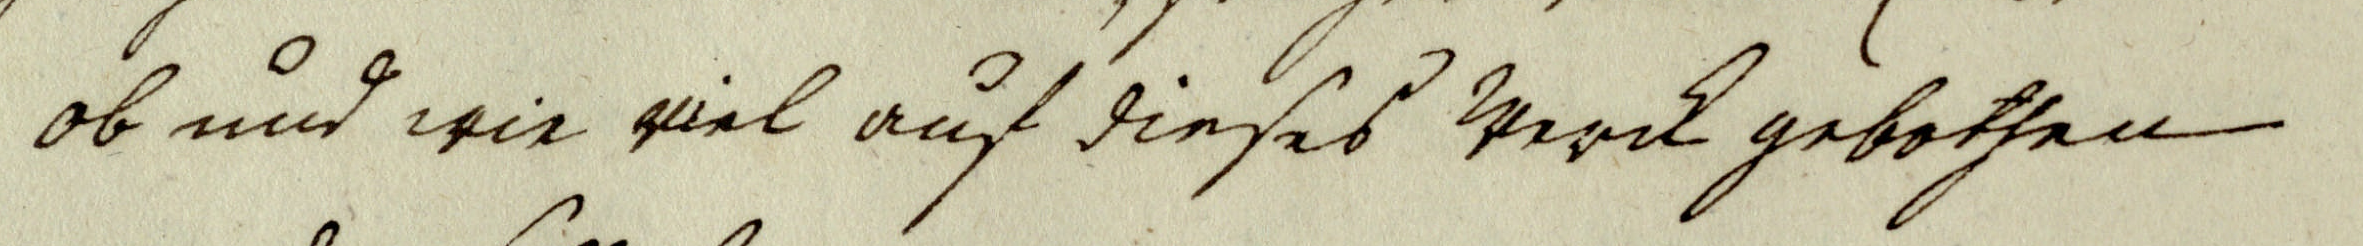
ob und wie viel auf dieses Werck gebothen
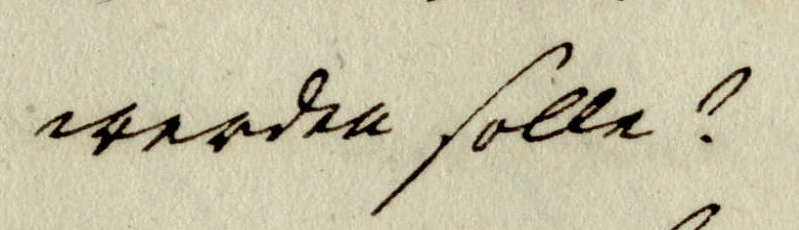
werden solle?
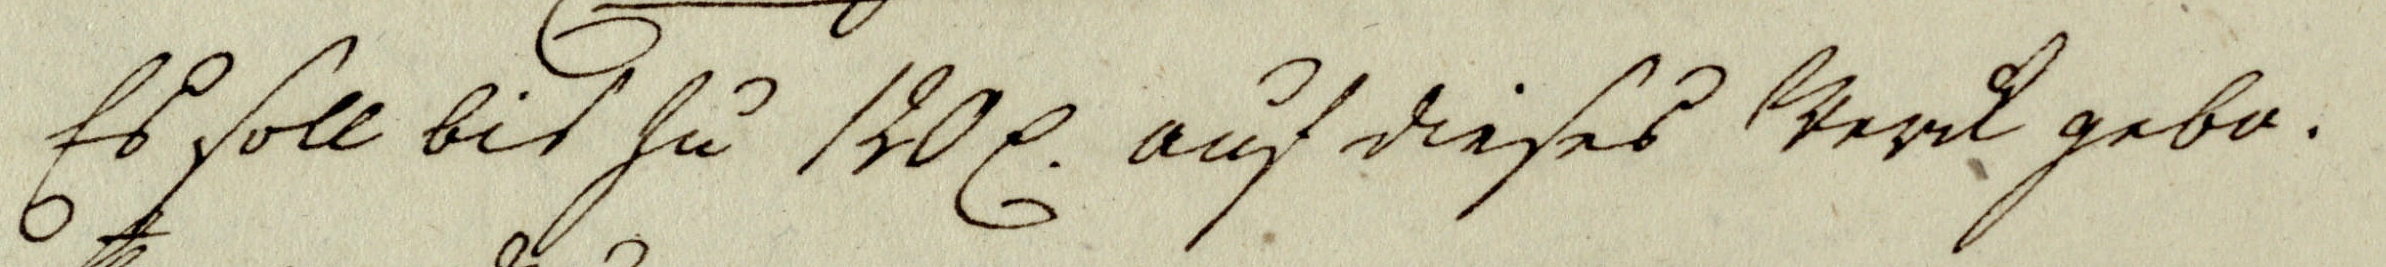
Es soll bis zu 120 l. auf dieses Werck gebo¬
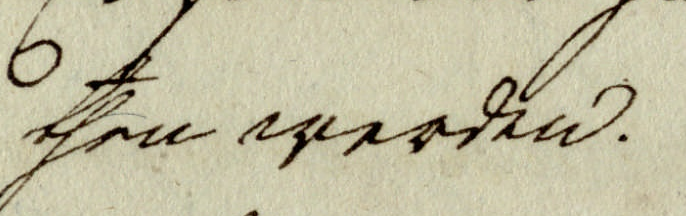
then werden.
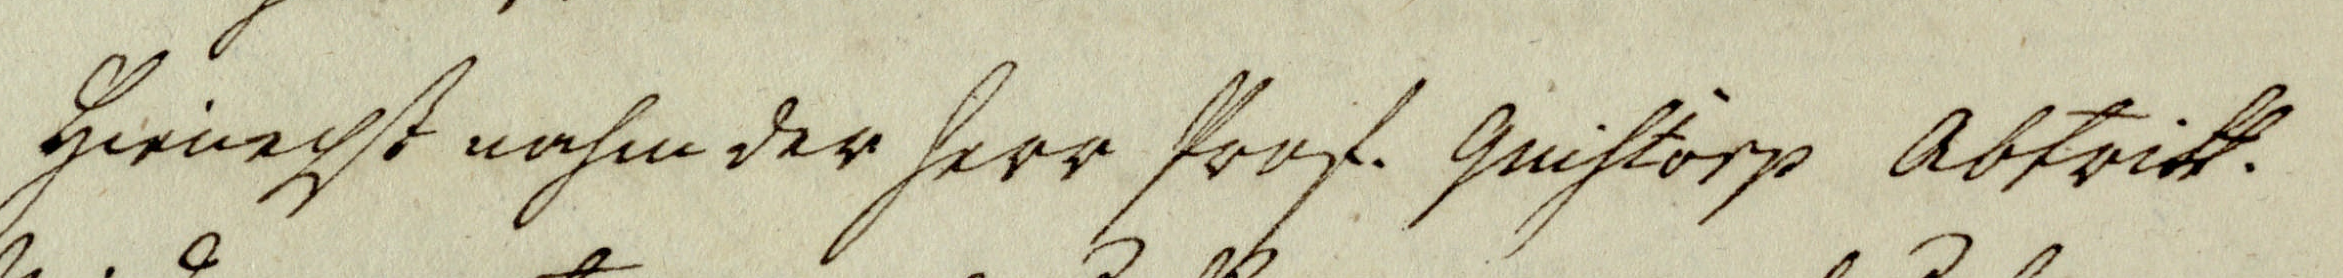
Hienechst nahm der Herr Prof. Quistorp Abtritt.
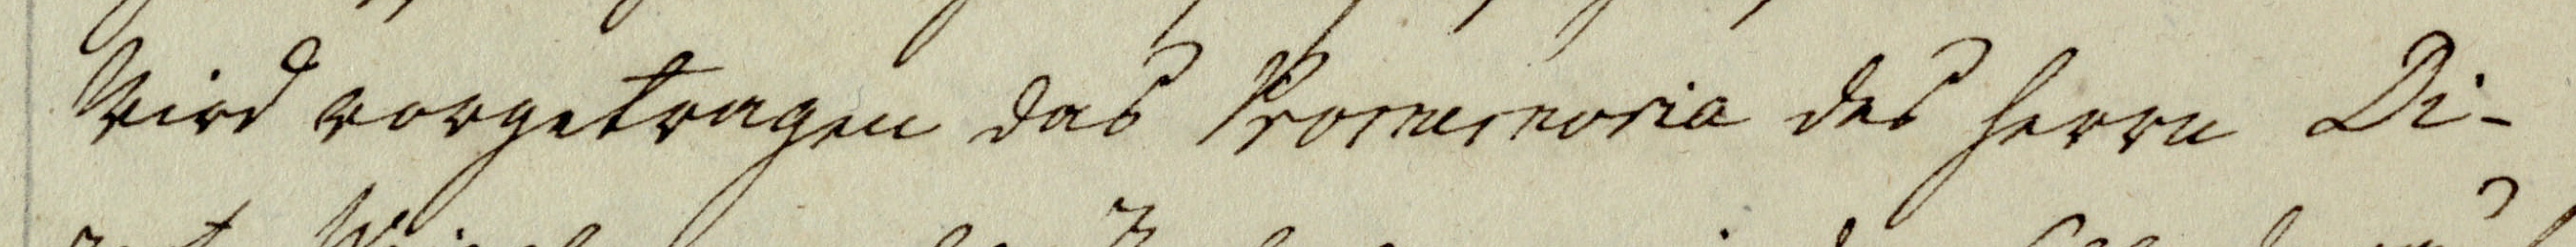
8. Wird vorgetragen das Promemoria des Herrn Di¬
